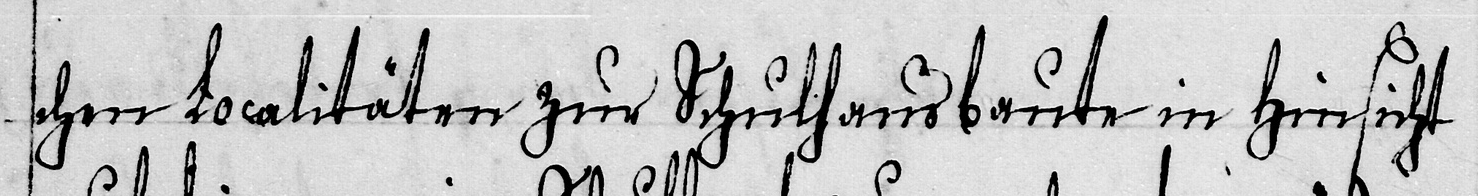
chen Localitäten zur Schulhausbaute in Hinsicht
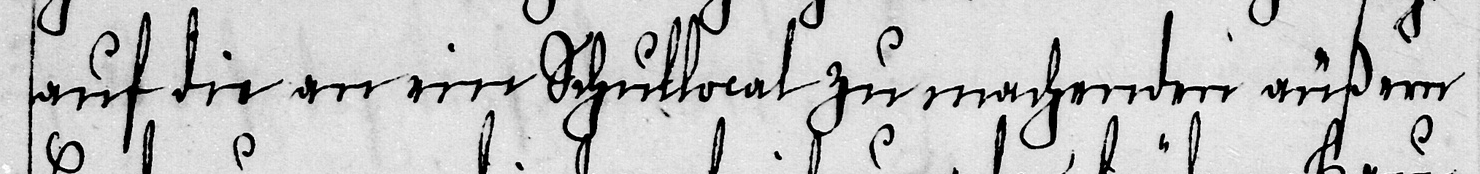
auf die an ein Schullocal zu machenden äußern
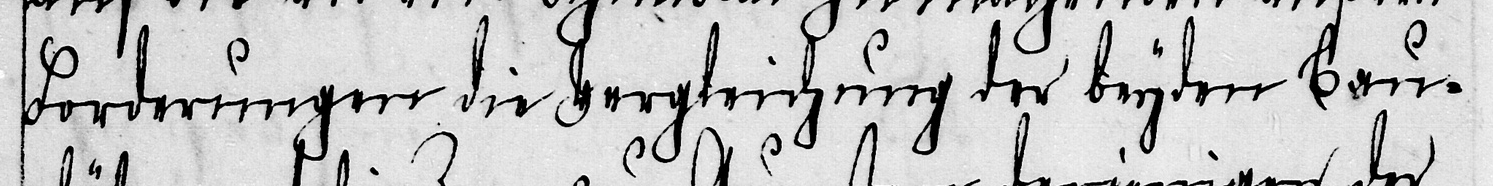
Forderungen die Vergleichung der beyden Bau¬
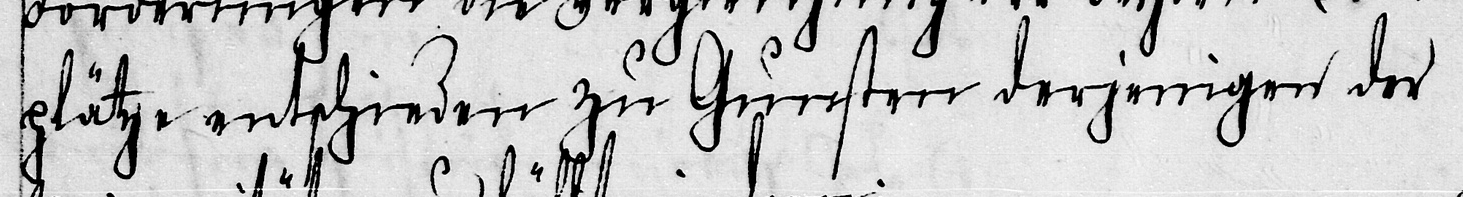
plätze entschieden zu Gunsten derjenigen der
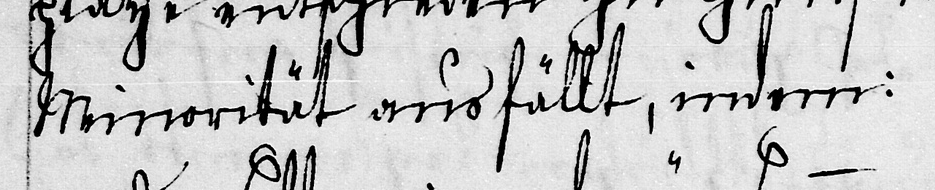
Minorität ausfällt, indem:
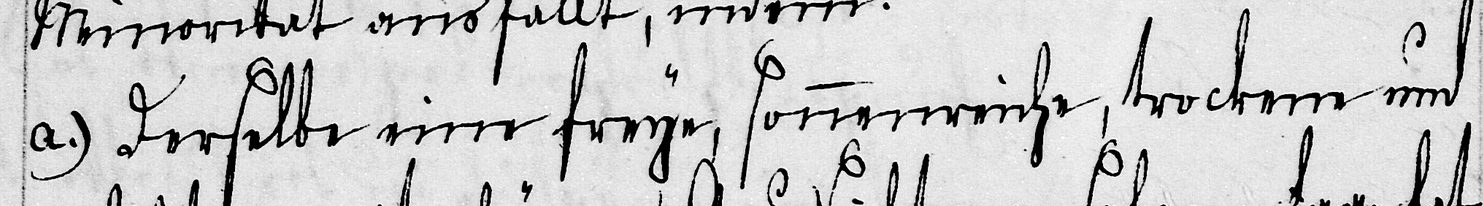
a.) Derselbe eine freye, sonnenreiche, trockene und
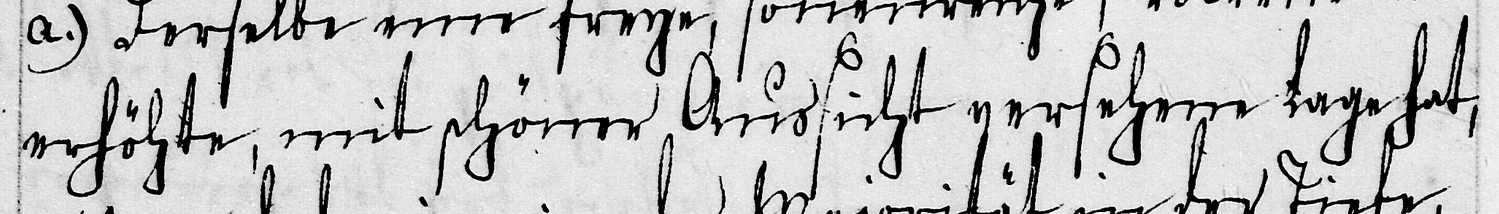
erhöhte, mit schöner Aussicht versehene Lage hat,
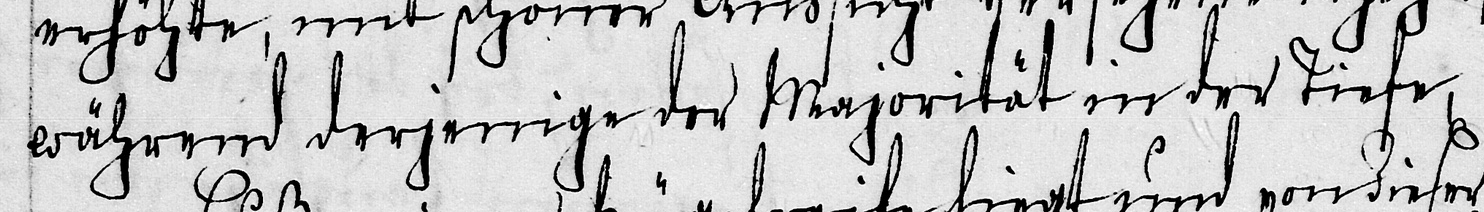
während derjenige der Majorität in der Tiefe,
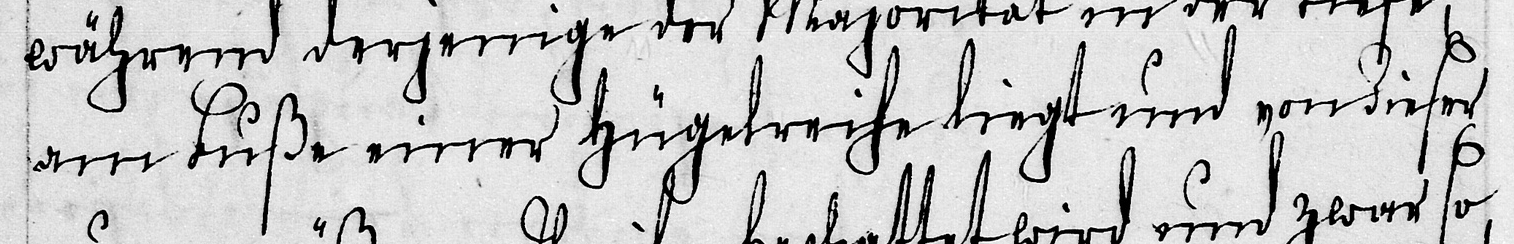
am Fuße einer Hügelreihe liegt und von dieser
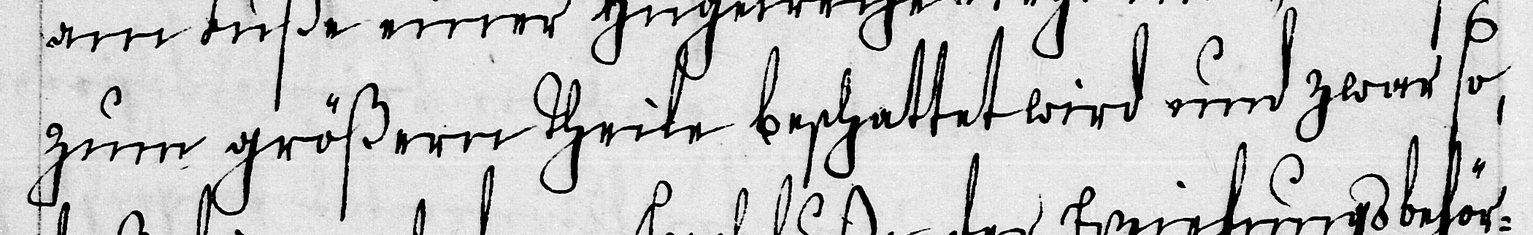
zum größern Theile beschattet wird und zwar so,
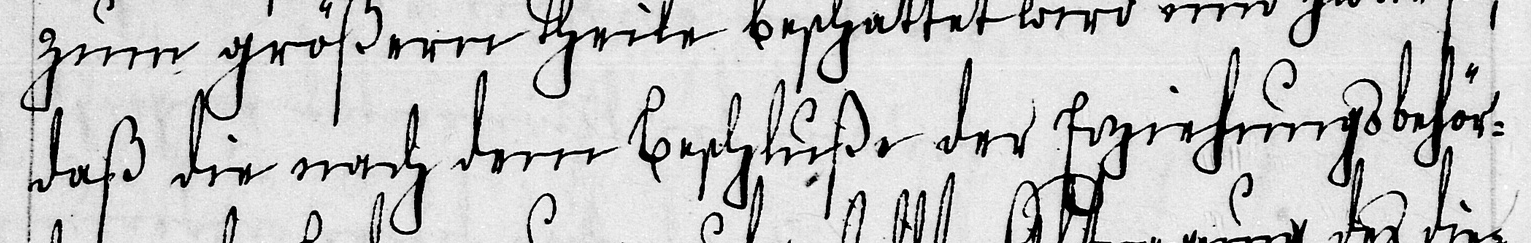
daß die nach dem Beschluße der Erziehungsbehör¬
